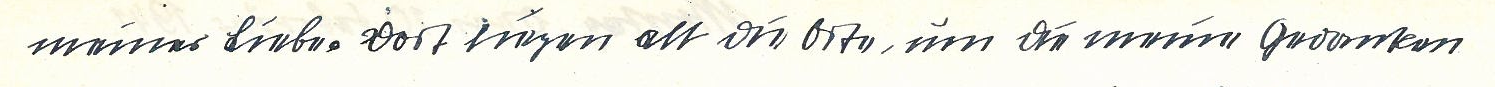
meiner Liebe. Dort liegen all die Orte, um die meine Gedanken
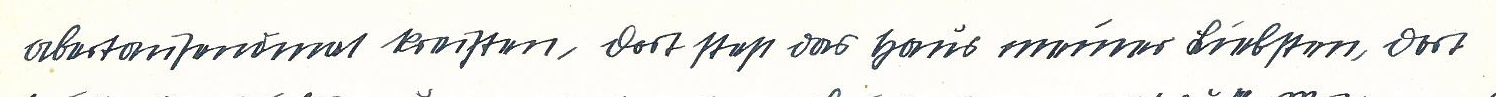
abertausendmal kreisten, dort steht das Haus meiner Liebsten, dort
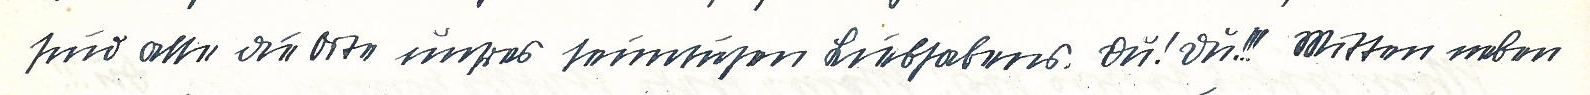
sind all die Orte unseres heimlichen Liebhabens. Du! Du!!! Mitten vieler
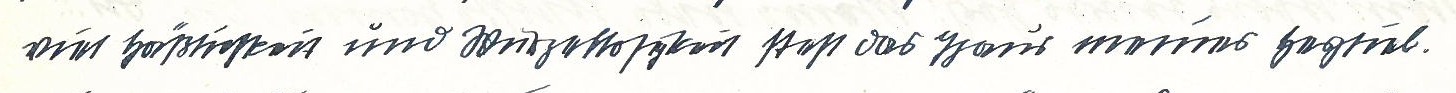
Häßlichkeit und Wurzellosigkeit steht das Haus meines Herzlieb.
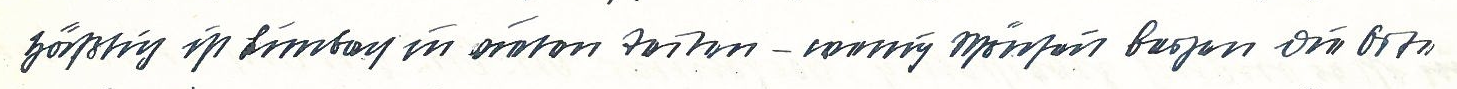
Häßlich ist L. in vielen Teilen – wenig Schönheit bergen die Orte
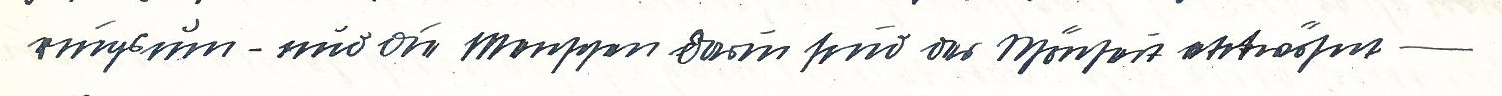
ringsum – und die Menschen darin sind der Schönheit entwöhnt –
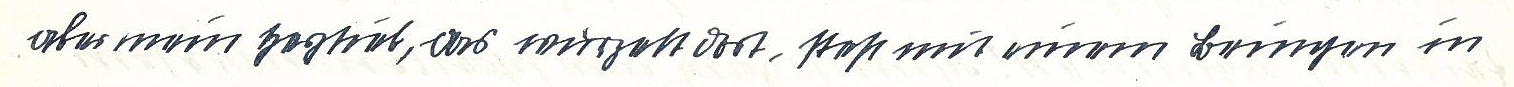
aber mein Herzlieb, das wurzelt dort, steht mit einem Beinchen in
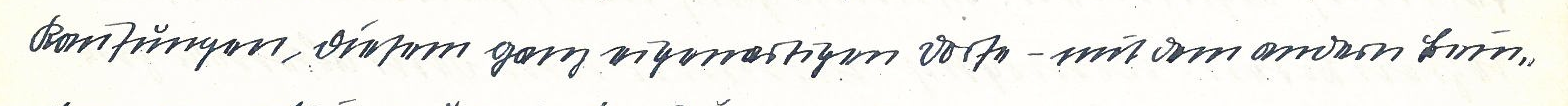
K., diesem ganz eigenartigen Orte – mit dem andern Bein¬
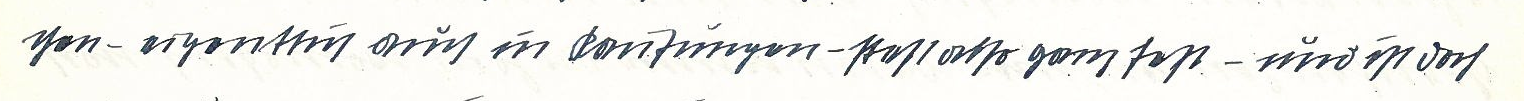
chen – eigentlich auch in K. – steht also ganz fest – und ist doch
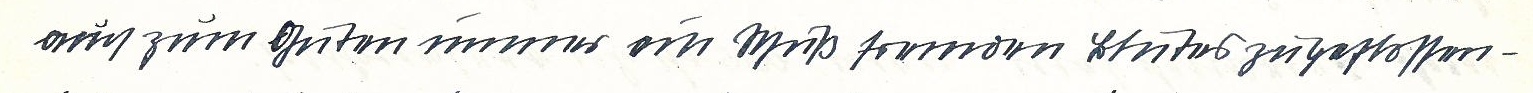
auch zum Guten immer ein Schuß fremden Blutes zugeflossen –
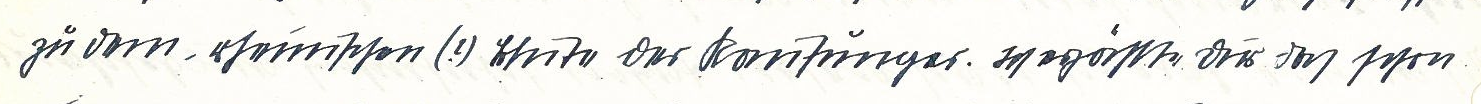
zu dem rheinischen (?) Blute der K.er. Ich erzählte Dir doch schon
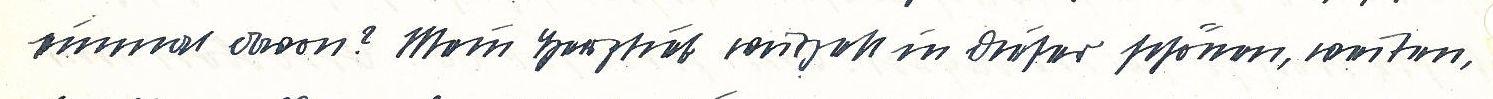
einmal davon? Mein Herzlieb wurzelt in dieser schönen, weiten,
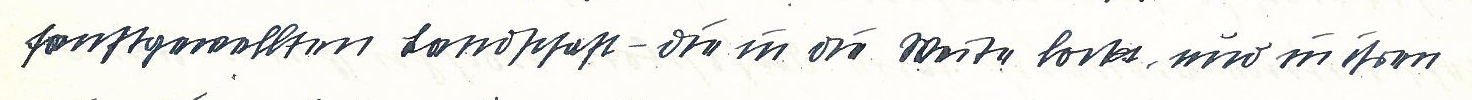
sanftgewellten Landschaft – die in die Weite lockt, und in ihren
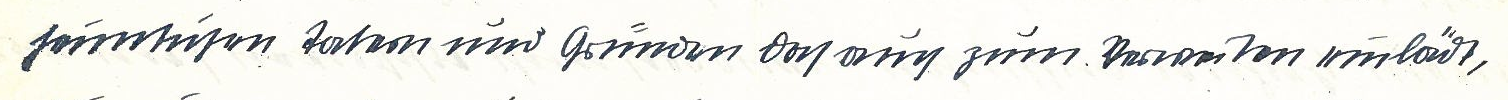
heimlichen Talern und Gründen doch auch zum Verweilen einlädt,
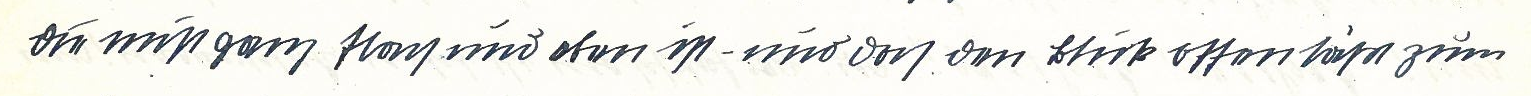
die nicht ganz flach und eben ist – und doch den Blick offen läßt zum
